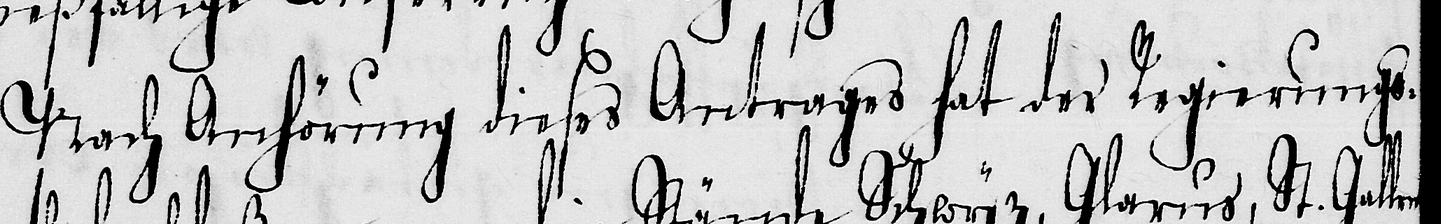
Nach Anhörung dieses Antrages hat der Regierungs¬
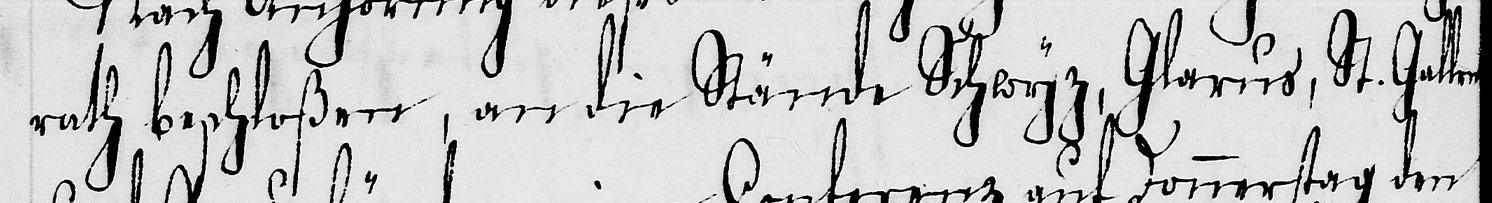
rath beschloßen, an die Stände Schwyz, Glarus, St.
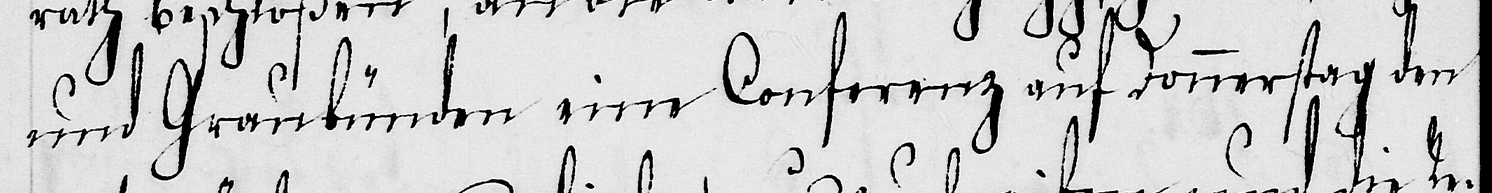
und Graubünden eine Conferenz auf Donnerstag den
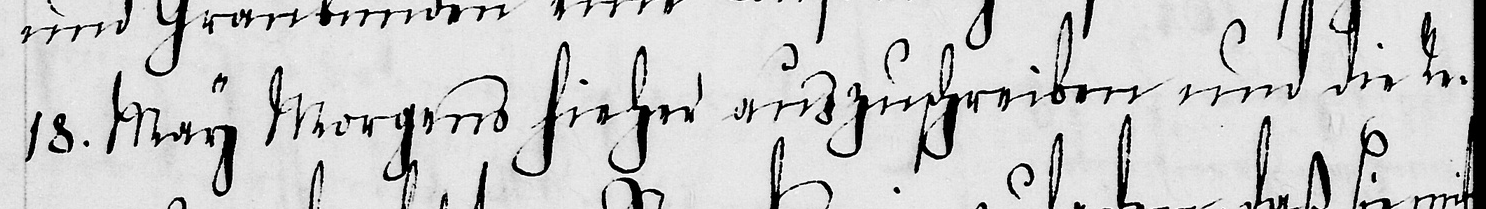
18. May Morgens hieher auszuschreiben und die Re¬
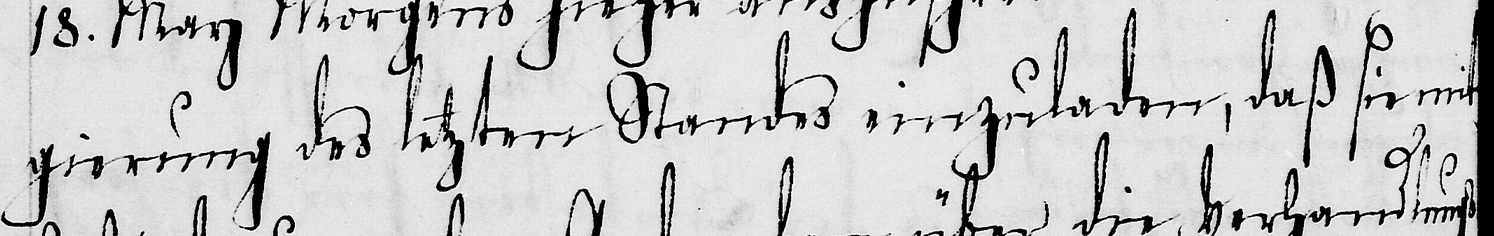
gierung des letzten Standes einzuladen, daß sie mit
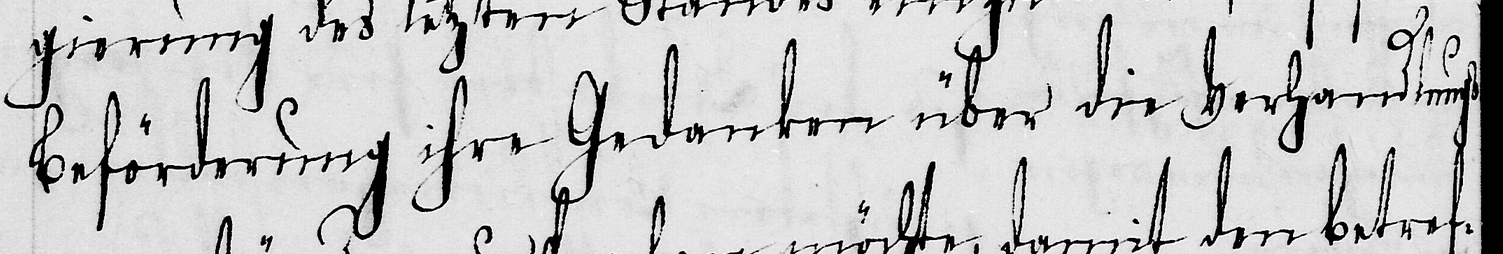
Beförderung ihre Gedanken über die Verhandlung¬
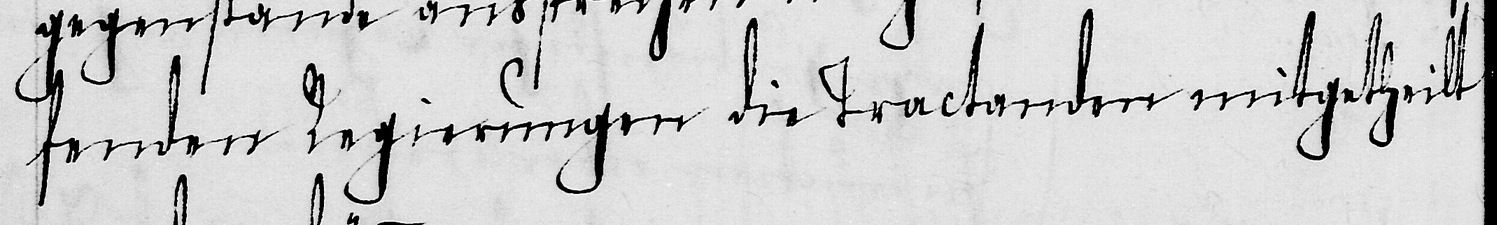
fenden Regierungen die Tractanden mitgetheilt
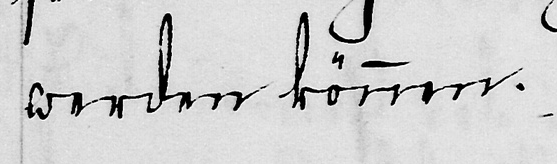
werden können.
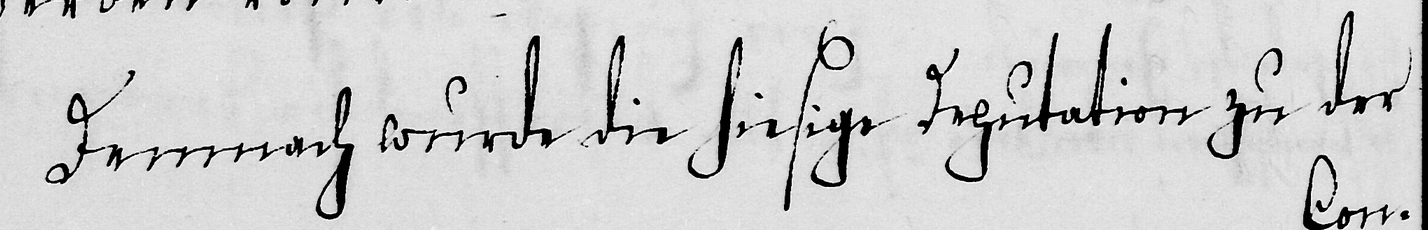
Demnach wurde die hiesige Deputation zu der
